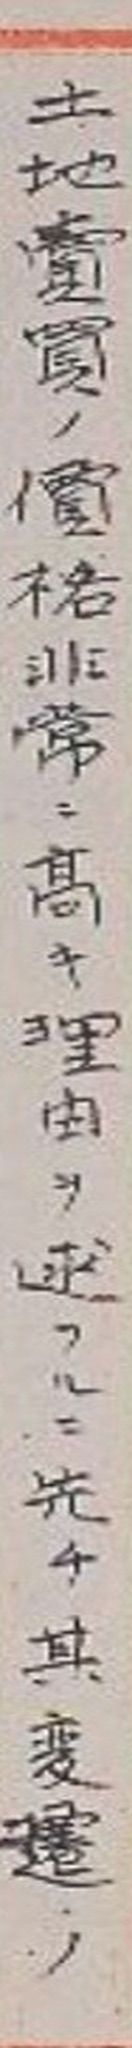土地賣買ノ價格非常ニ髙キ理由ヲ逑フルニ先チ変遷ノ
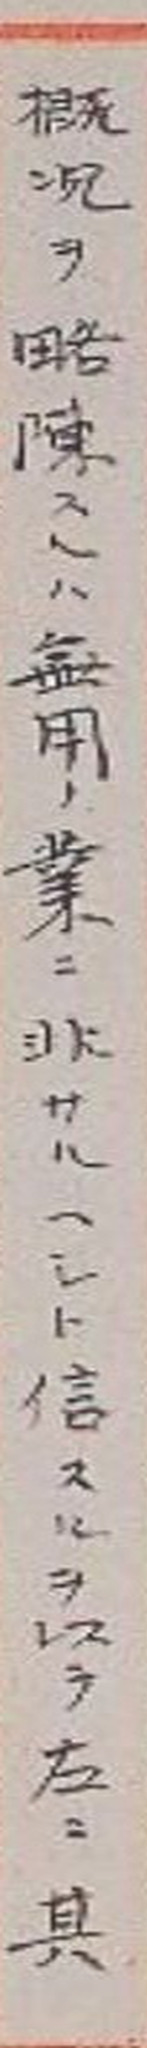概况ヲ略陳スルハ無用ノ業ニ非サルヘシト信スルヲ以テ左ニ其

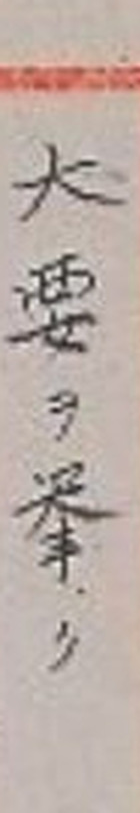大要ヲ挙ク
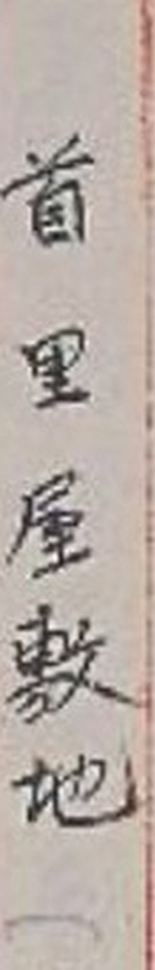首里屋敷地
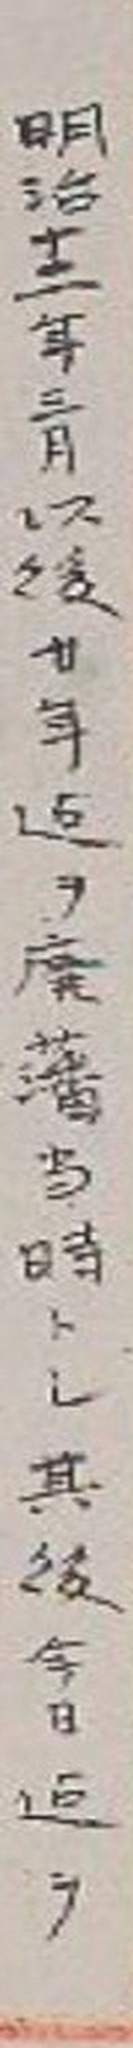明治十二年三月以後廿年迄ヲ廃藩当時トシ其後今日迄ヲ
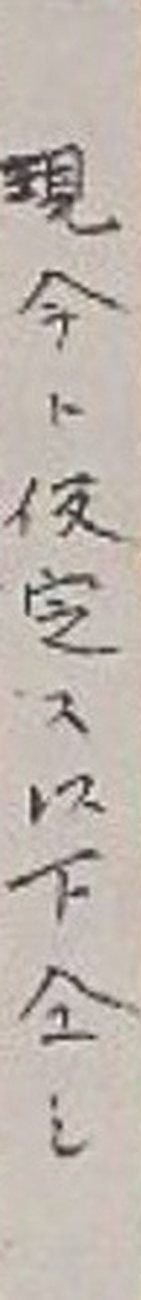現今ト仮定ス以下仝シ
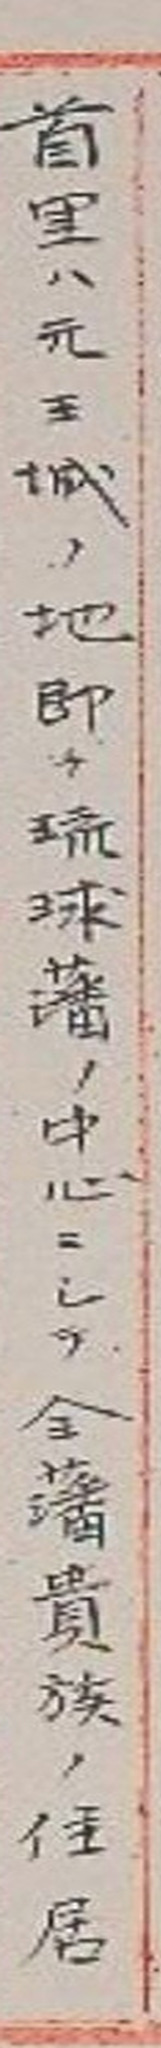首里ハ元王城ノ地即チ琉球藩ノ中心ニシテ全藩貴族ノ住居
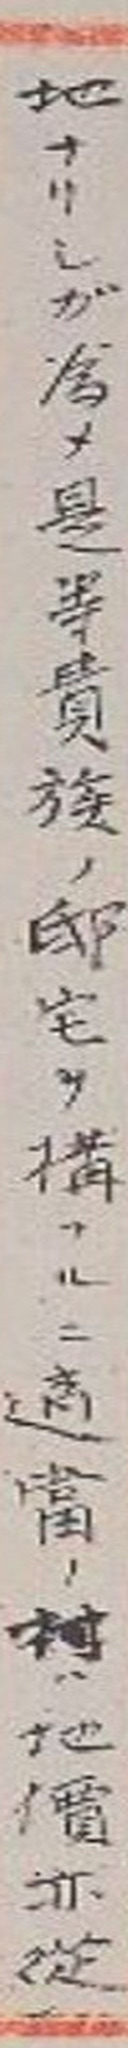地ナリシガ為メ是等貴族ノ邸宅ヲ構フルニ適当ノ村ハ地価亦従
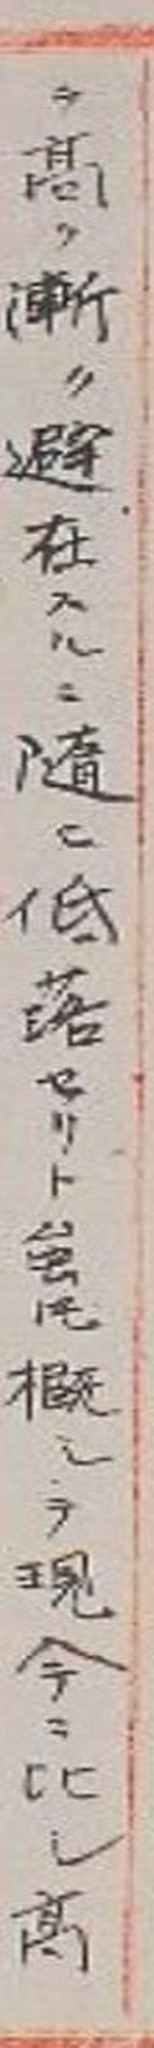テ高ク漸ク避在スルニ随ヒ低落セリト雖トモ概シテ現今ニ比シ高
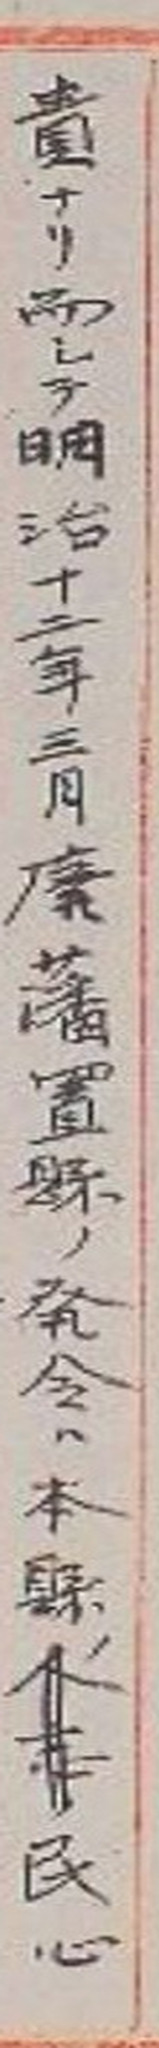貴ナリ而シテ明治十二年三月廃藩置県ノ発令ハ本県ノ民心
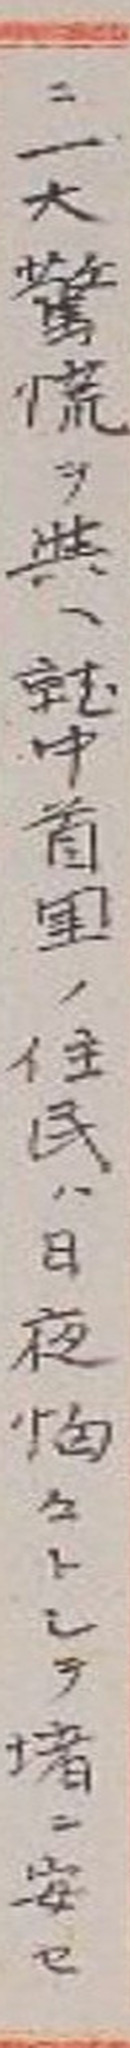ニ一大驚慌ヲ与ヘ就中首里ノ住民ハ日夜恟々トシテ堵ニ安セ
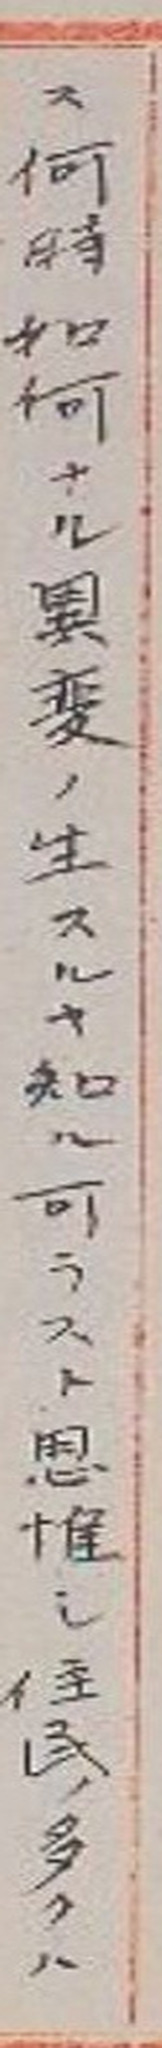ス何時如何ナル異変ノ生スルヤ知ル可カラスト思惟シ住民ノ多クハ
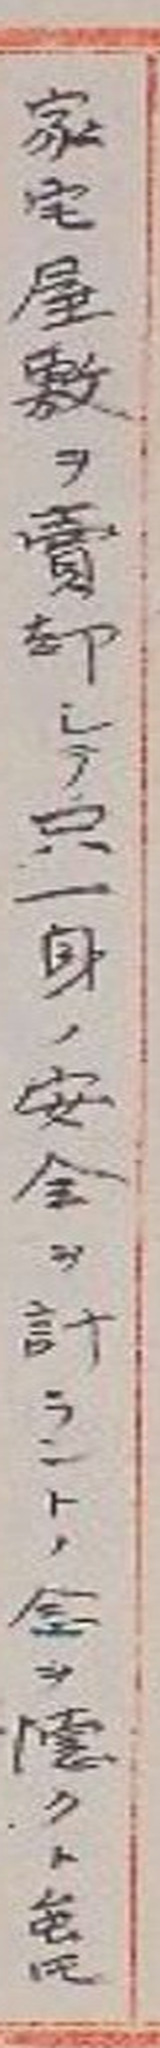家宅屋敷ヲ売却シテ只一身ノ安全ヲ計ラントノ念ヲ懐クト雖トモ
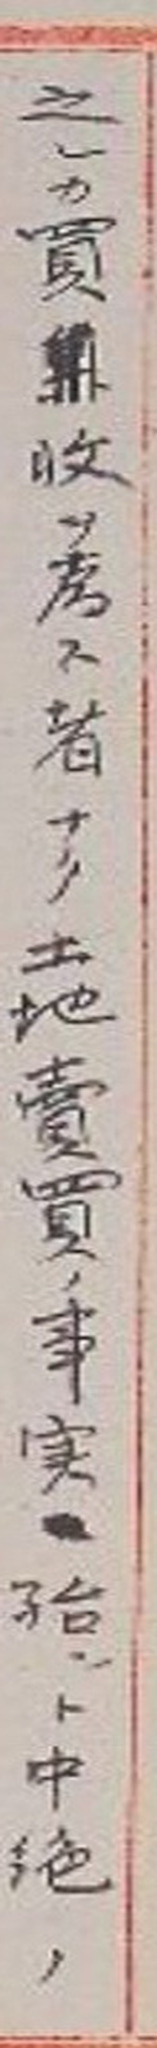之レカ買収ヲ為ス者ナク土地売買ノ事実殆ント中絶ノ
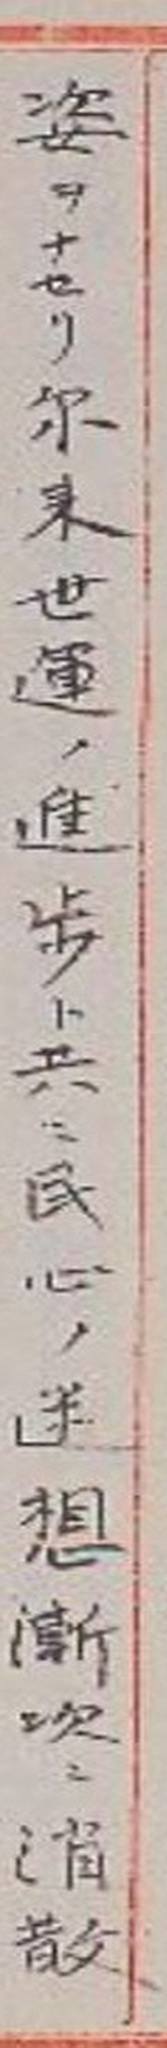姿ヲナセリ爾来世運ノ進歩ト共ニ民心ノ迷想漸次ニ消散
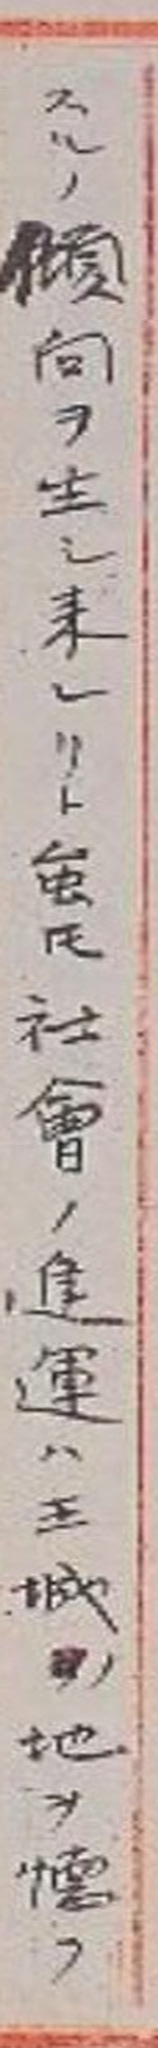スルノ傾向ヲ生シ来レリト雖トモ社会ノ進運ハ王城ノ地ヲ懐ク
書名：本県地価ノ高キ理由調書
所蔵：University of the Ryukyus Library
